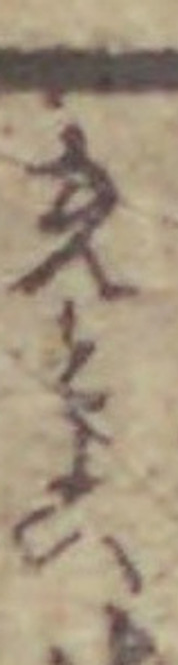なんとよい
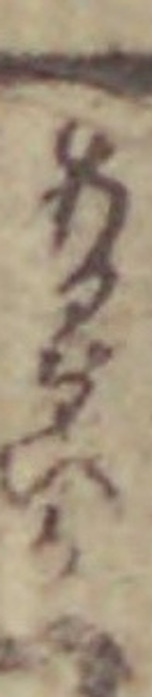あるまいか
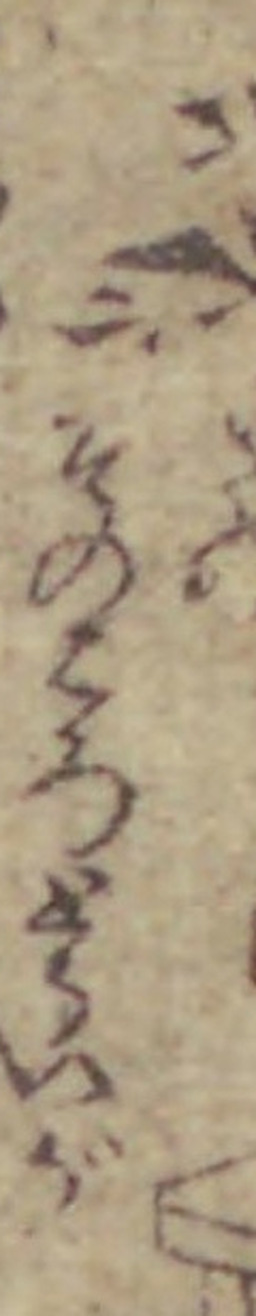そのころとういが
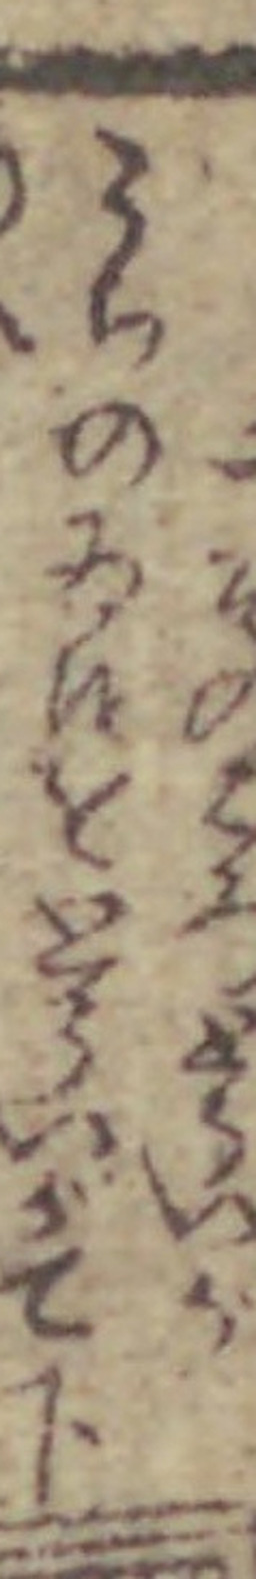うちのゐ候をとういがて下
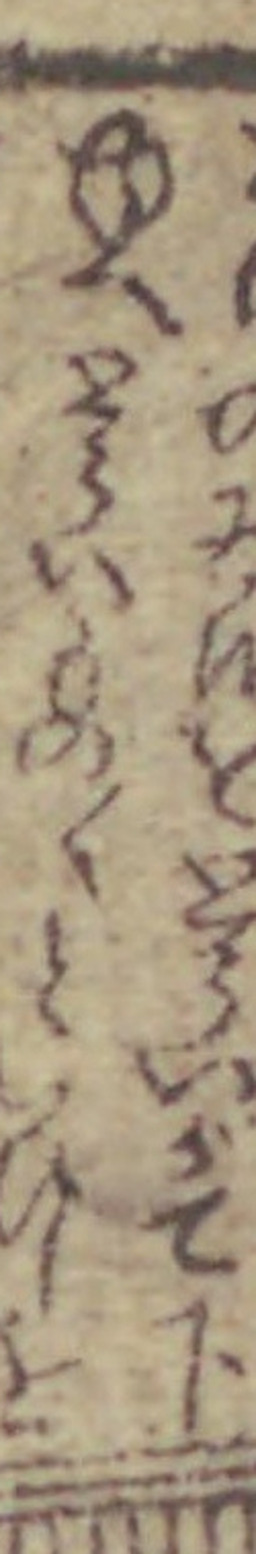ゆへとういもの〳〵といひしを
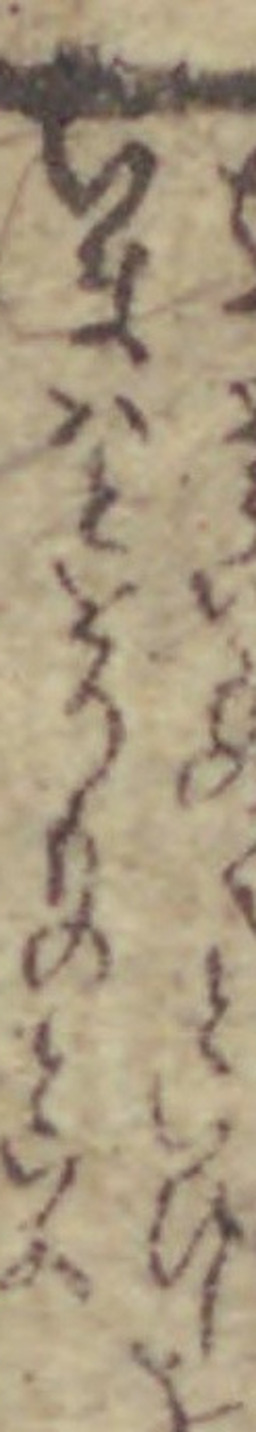いまはととりものといふ
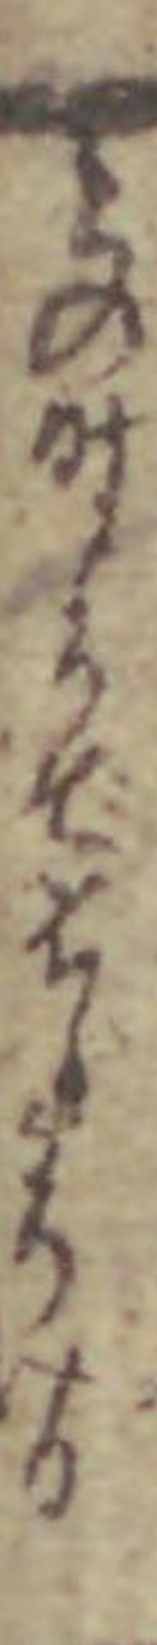この時よりぞはしまりける
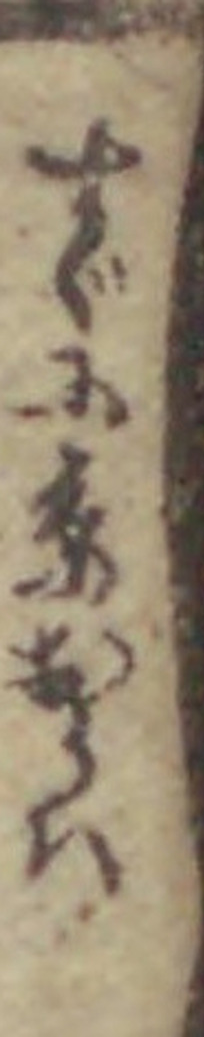すぐに京おうは
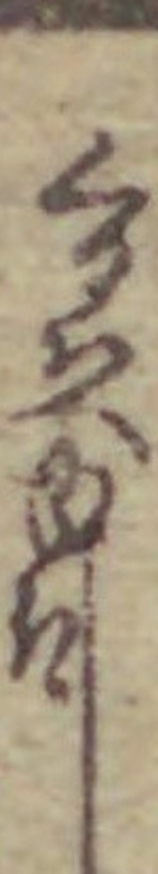くるはへゆき
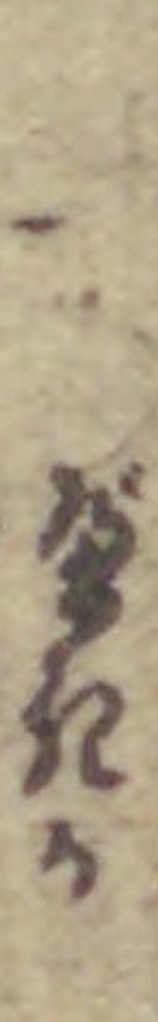べきか
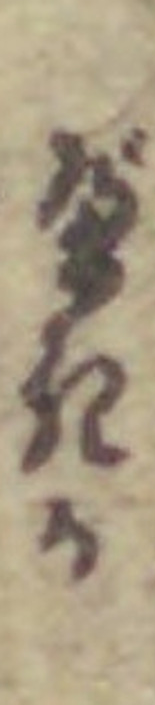べきか
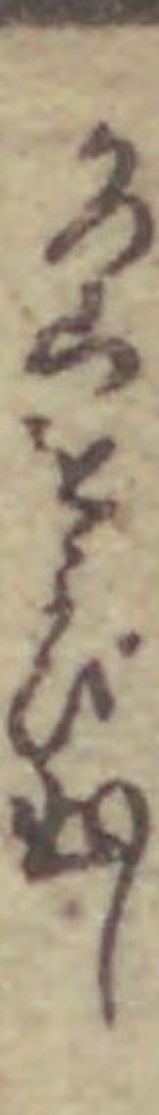かつ山をよび出し
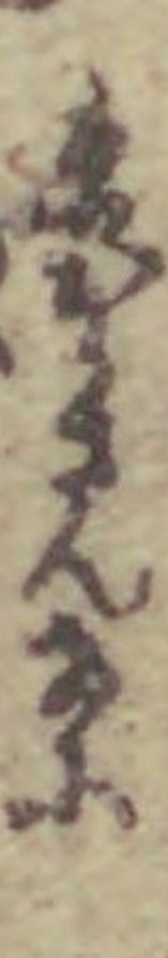京おうさんなに
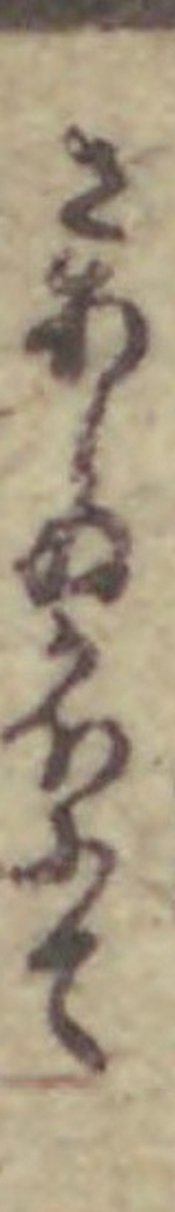さあらぬかほにて
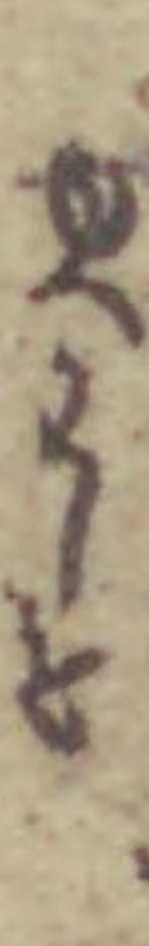ゆへわしを
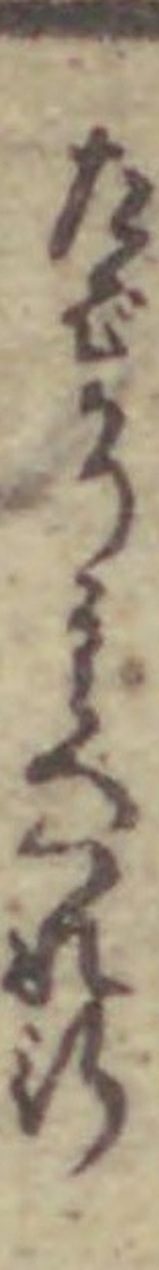たばかりうらへつれ行
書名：大通其面影 2巻
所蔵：国立国会図書館 National Diet Library, JAPAN
